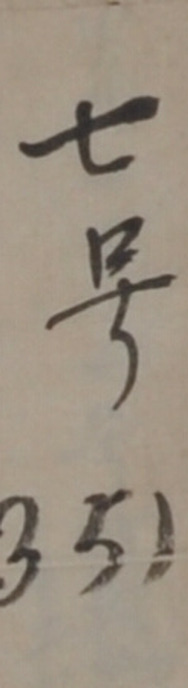七号()
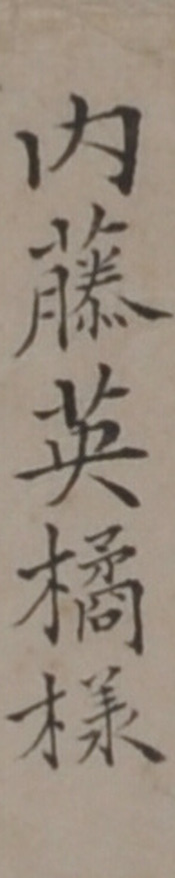内藤英橘様
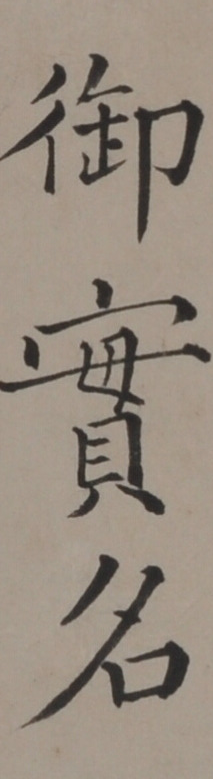御実名
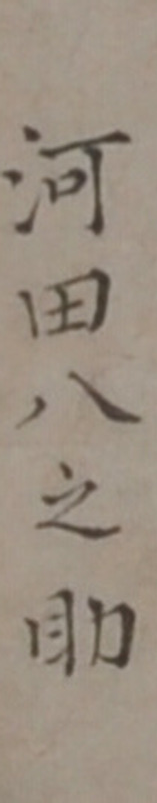河田八之助

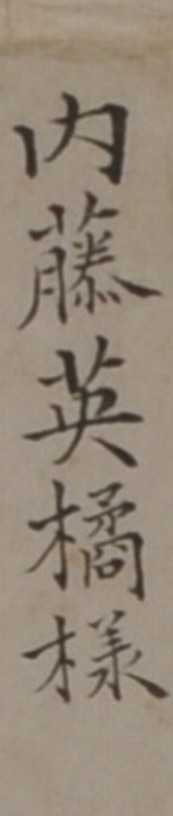内藤英橘様
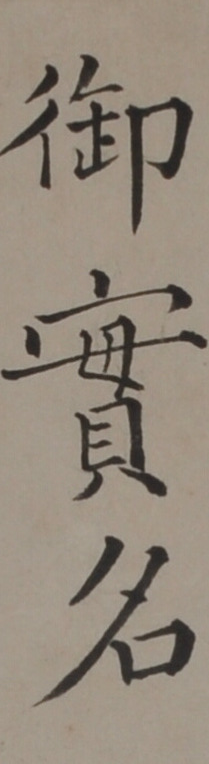御実名

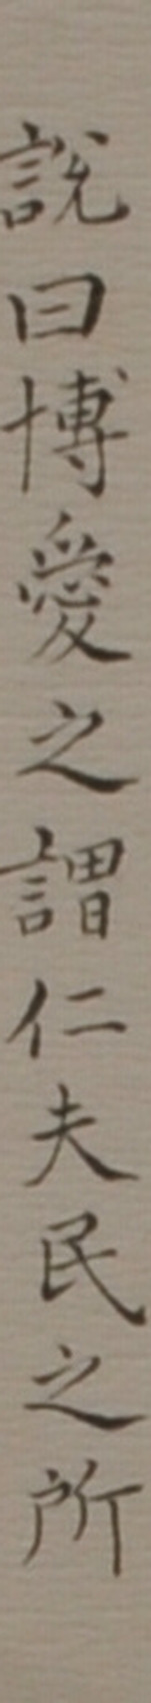説曰博愛之謂仁夫民之所
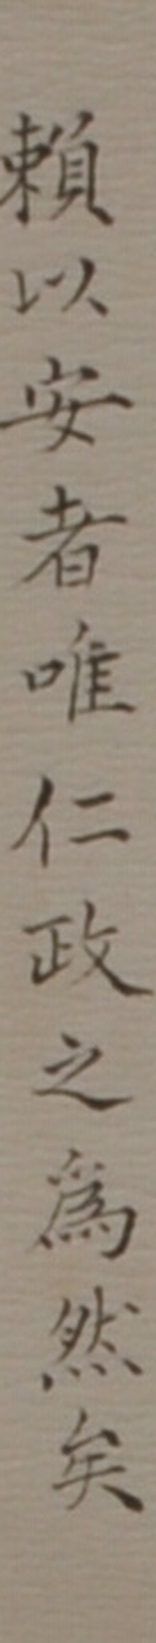頼以安者唯仁政之為然矣
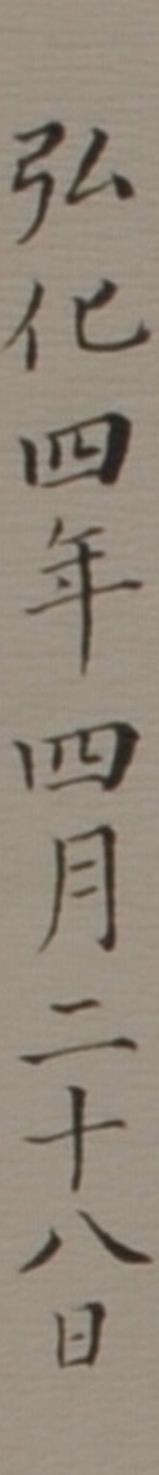弘化四年四月二十八日
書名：御実名
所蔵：伊那市立高遠町図書館・合同会社AMANE
